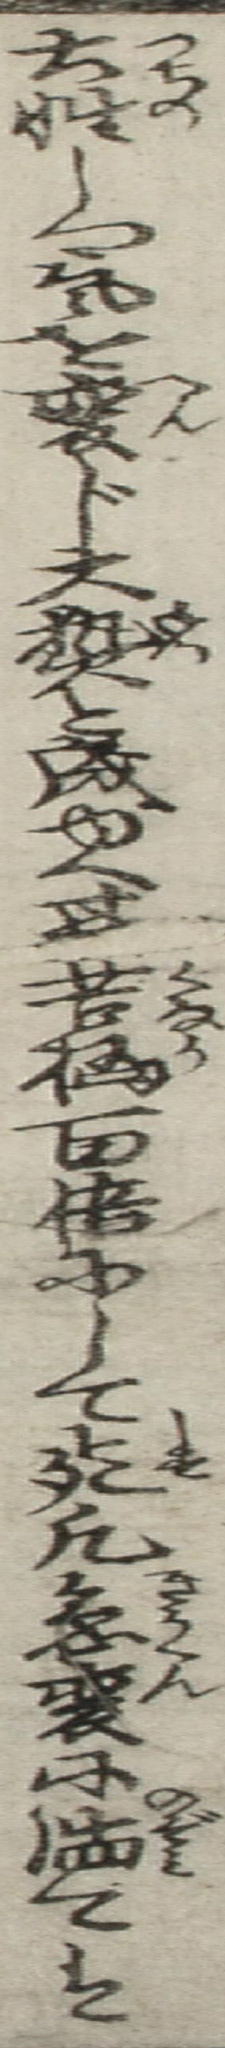土性しつ気を変じ大熱と成ゆへ其苦悩百倍にして死凡急変に臨ては
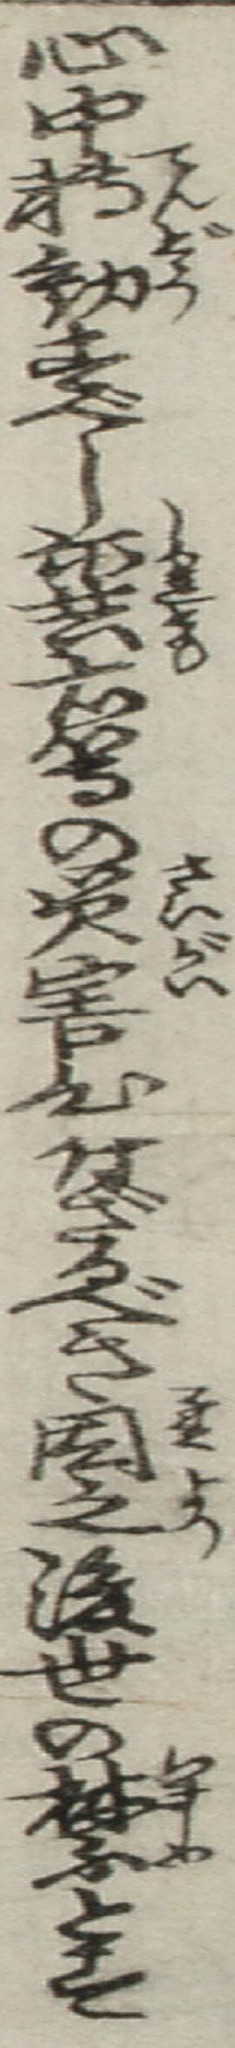心中転動すべし尓共右等の災害心付ざるべき因之後世の禁とす
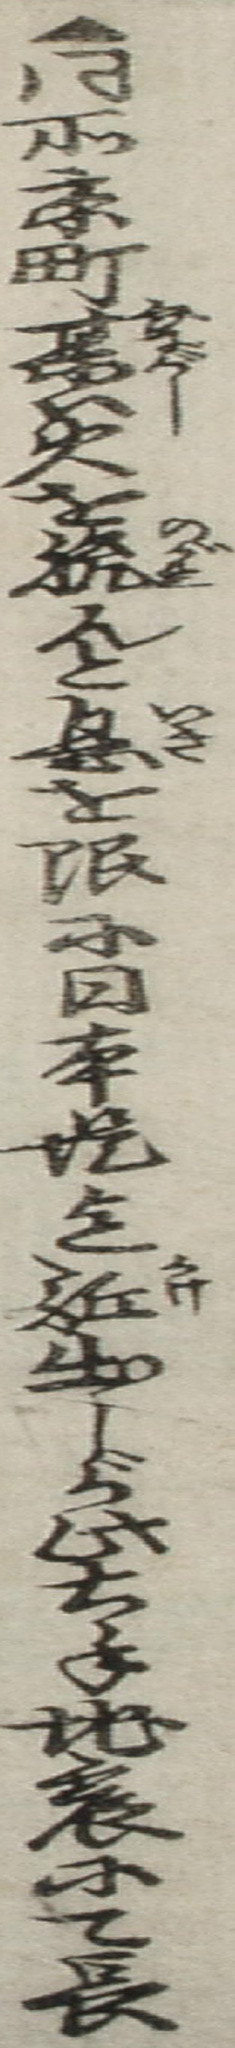▲同所京町某は火を脱んと息を限に日本堤を駈出しが此土手地震にて長
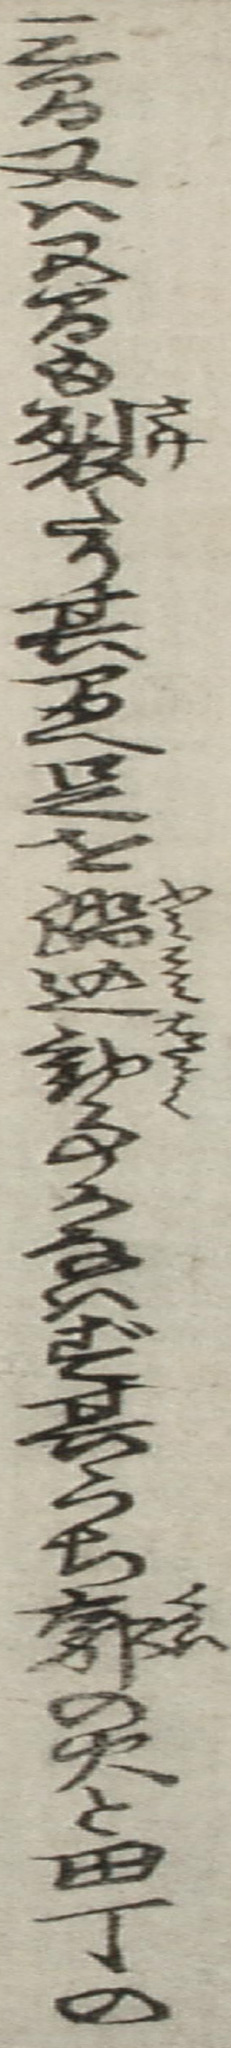三間又は五間も裂たり其間へ足を踏込動事かなはず其うち郭の火と田丁の
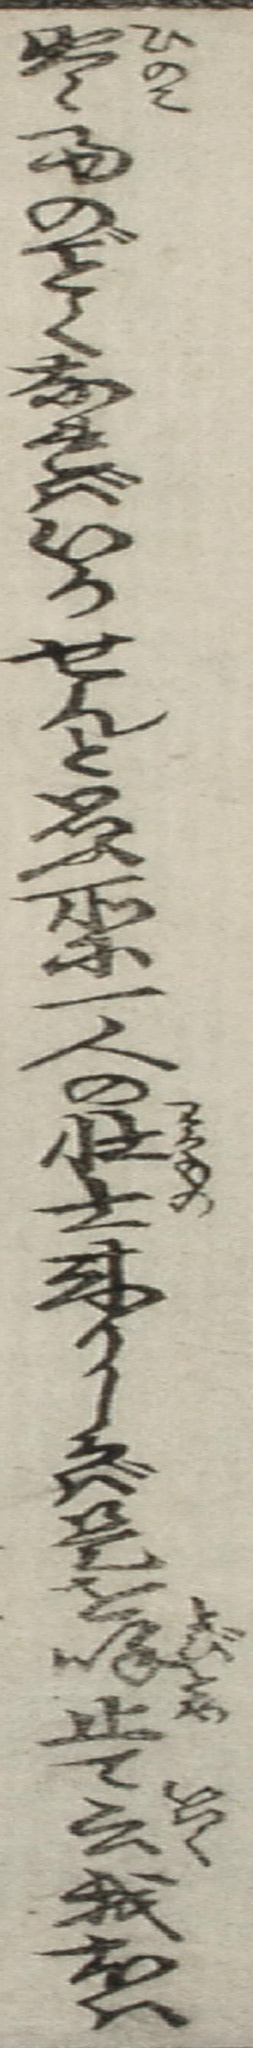炎雨のごとくなればいかせんと思ふ所に一人の壮士来りしかば是を呼止て云我おは
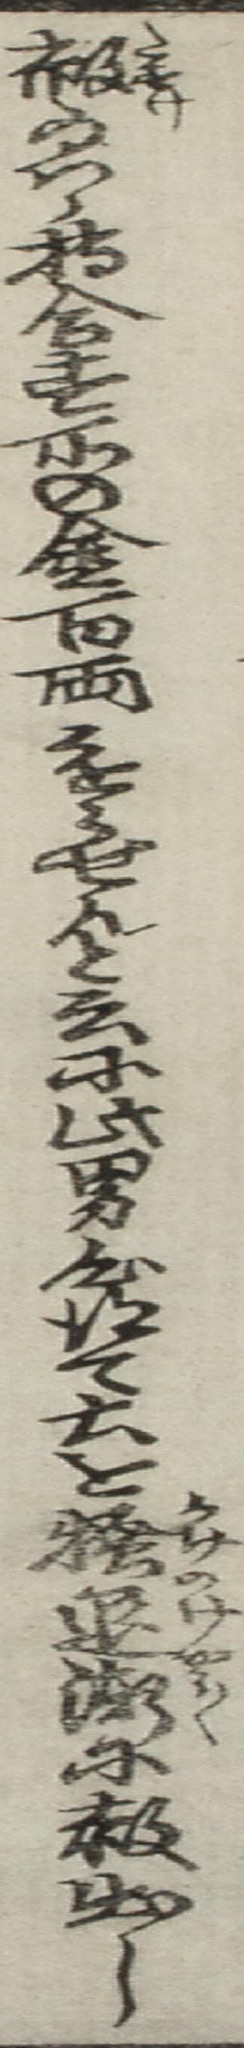赦給はゝ持合す所の金百両進らせんと云に此男心得て土を掻退漸に赦出し
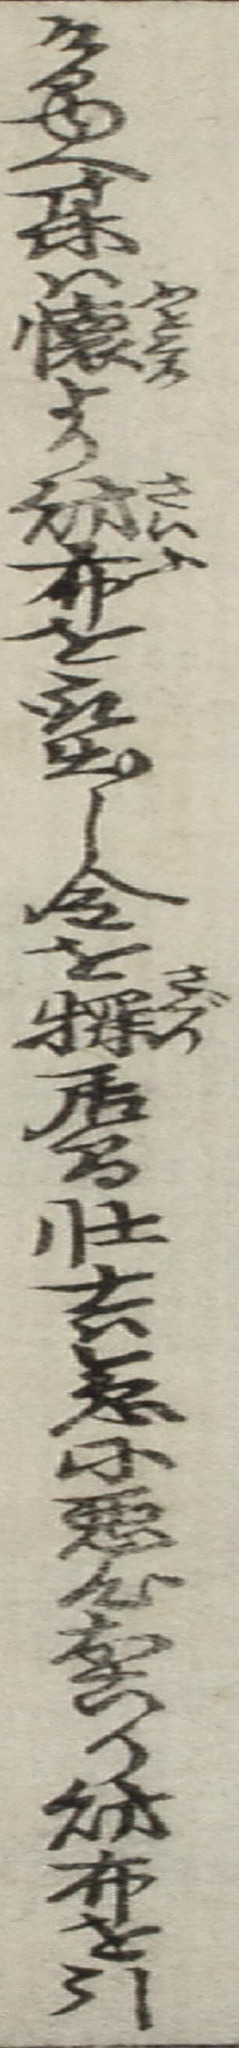けるゆへ某は懐より財布を取出し金を探居間壮士は急に悪心おこり財布を引
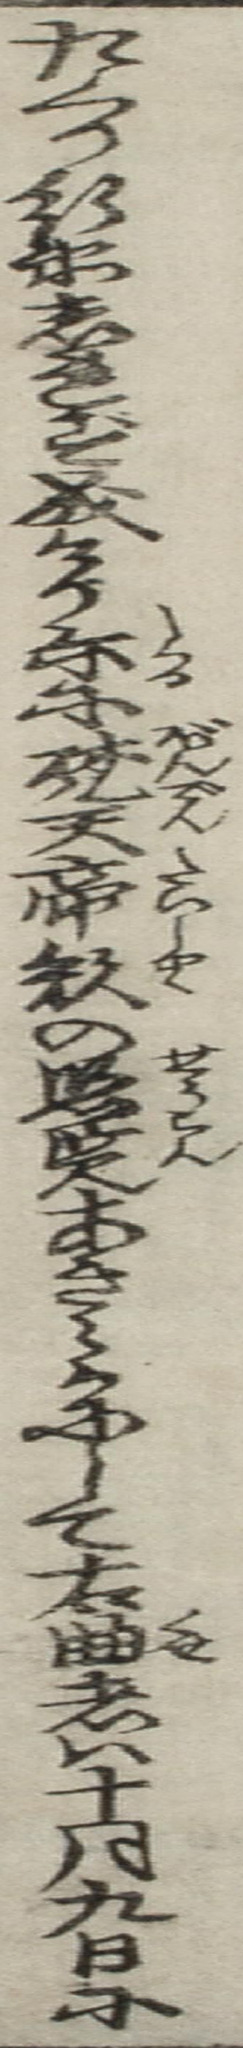たくり行衛しれず成けり尓に梵天帝釈の照覧あきらかにして右曲者は十月九日に
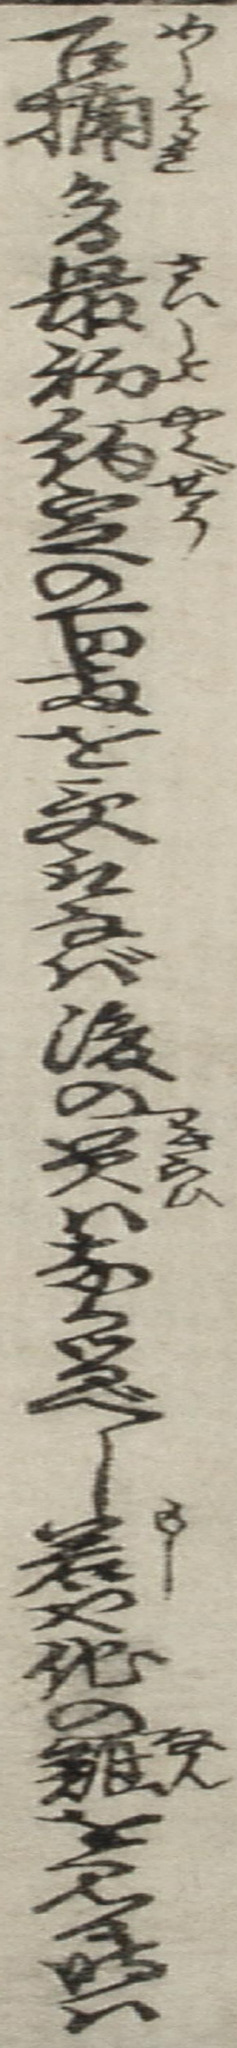召捕ける最初約定の百両を受取なば後の災はなかるべし若や他の難を見る時は
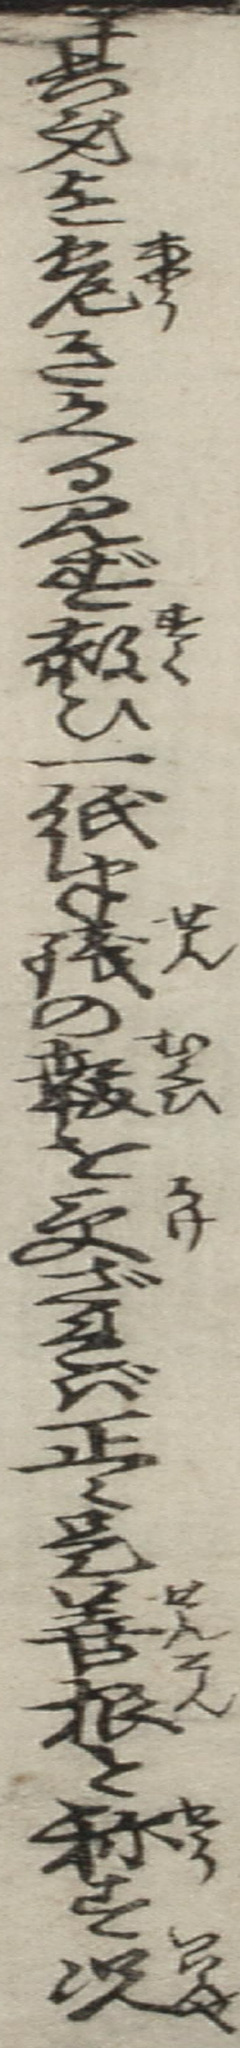其身迄危きかへる見ず赦ひ一紙半銭の報を受ざれば正に是善根と称す況
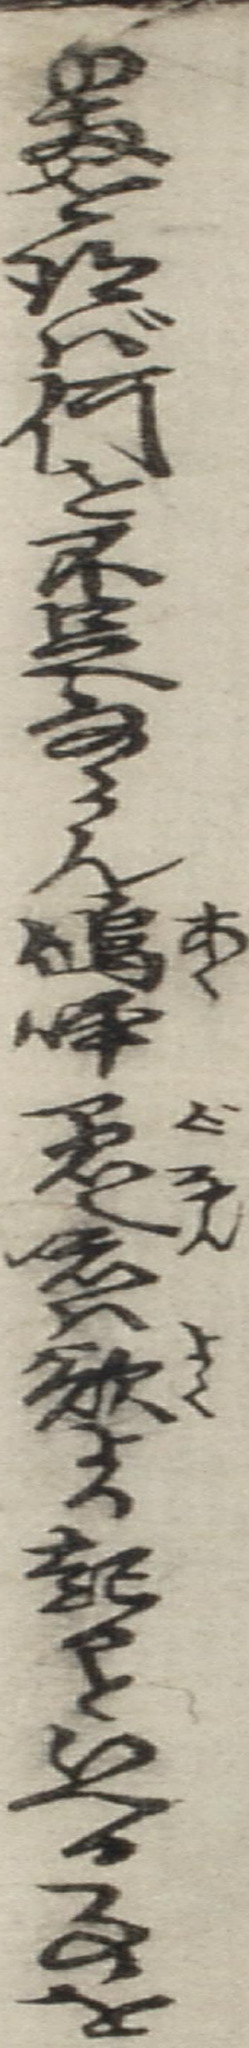百両を得ば何を不足ならん嗚呼愚念は欲より起るといへる事を
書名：安政見聞誌　下
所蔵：東京大学地震研究所図書室 Earthquake Research Institute Library, The University of Tokyo, JAPAN
